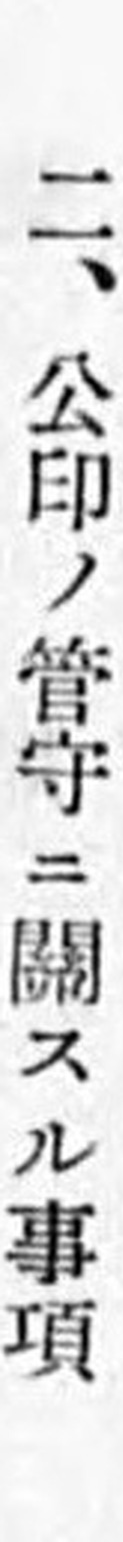二、公印ノ管守ニ関スル事項
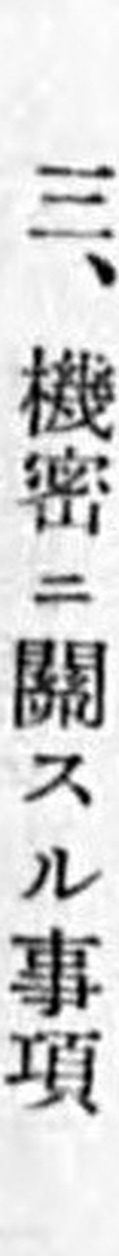三、機密ニ関スル事項
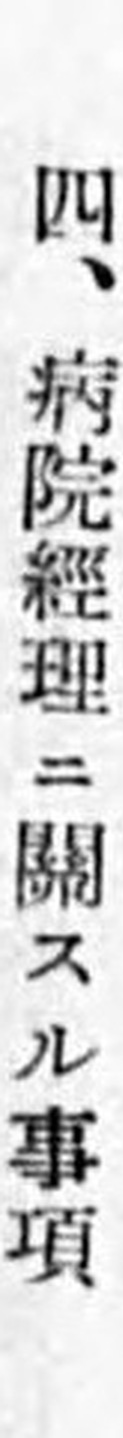四、病院経理ニ関スル事項
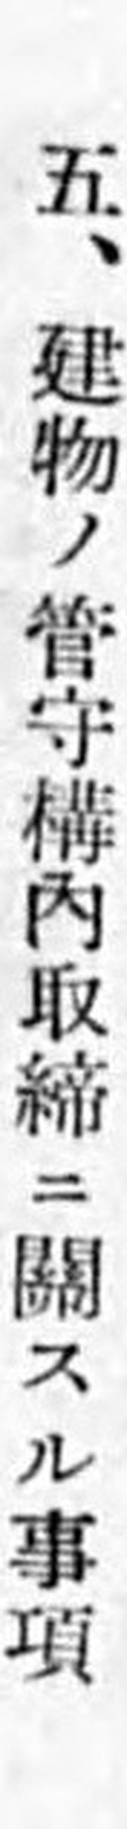五、建物ノ管守構内取締ニ関スル事項
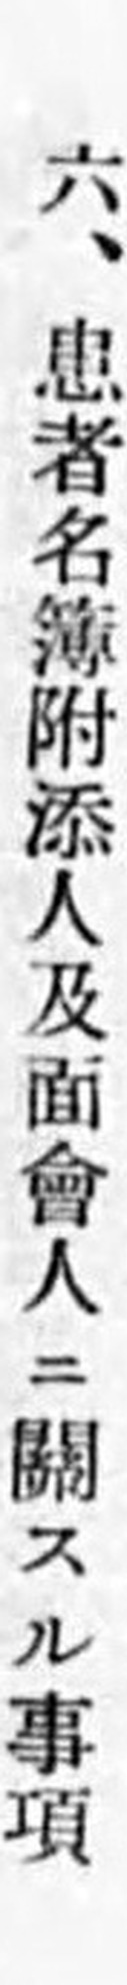六、患者名簿附添人及面会人ニ関スル事項
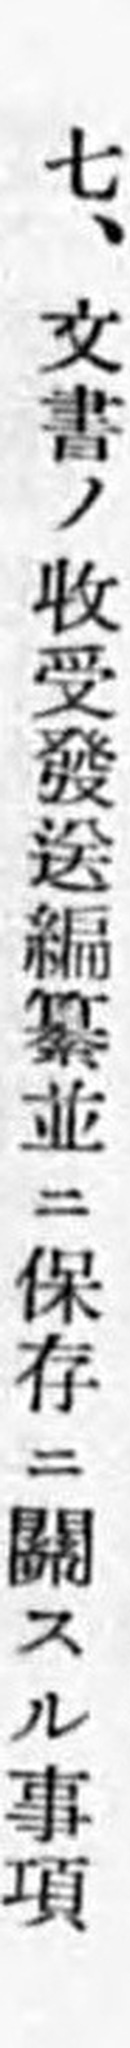七、文書ノ収受発送編纂並ニ保存ニ関スル事項
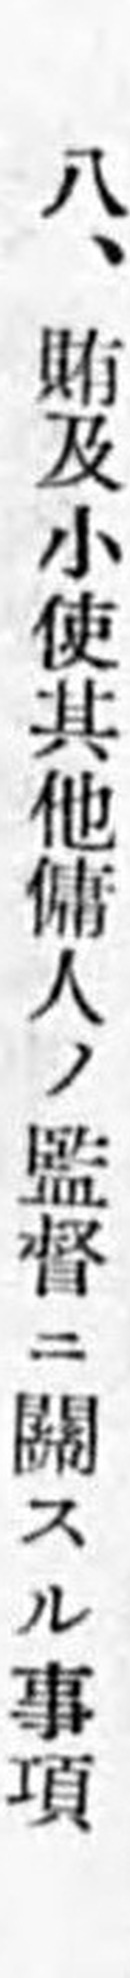八、賄及小使其他傭人ノ監督ニ関スル事項
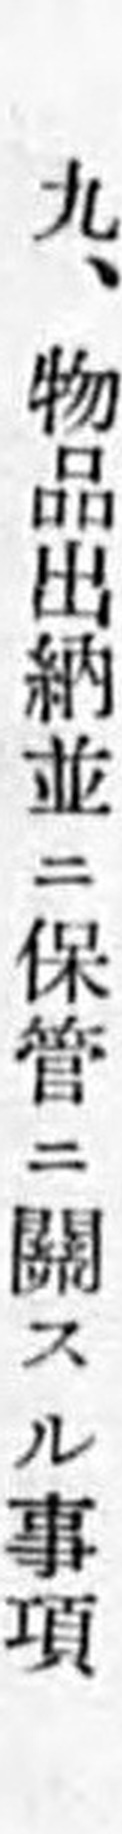九、物品出納並ニ保管ニ関スル事項
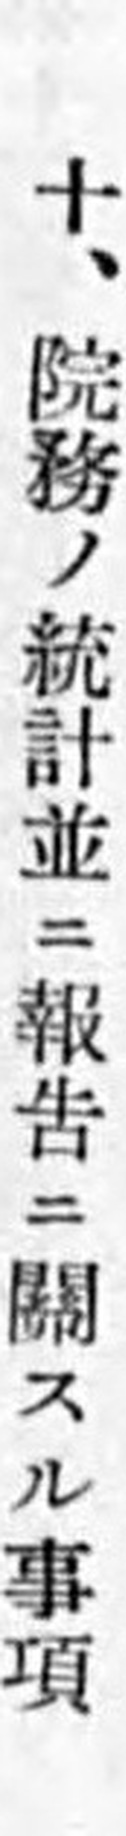十、院務ノ統計並ニ報告ニ関スル事項
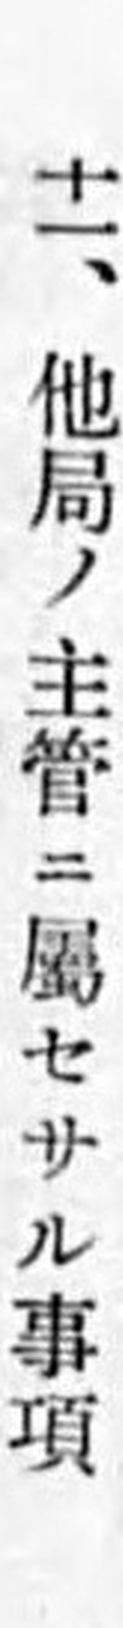十一、他局ノ主管ニ属セサル事項
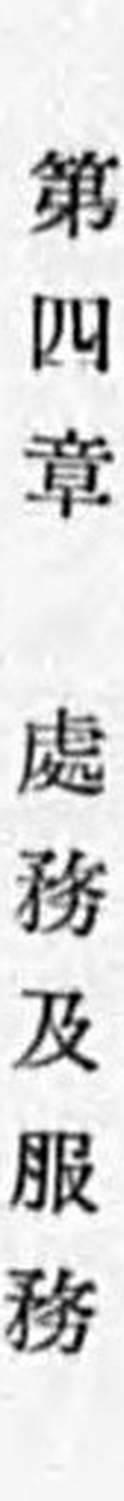第四章処務及服務
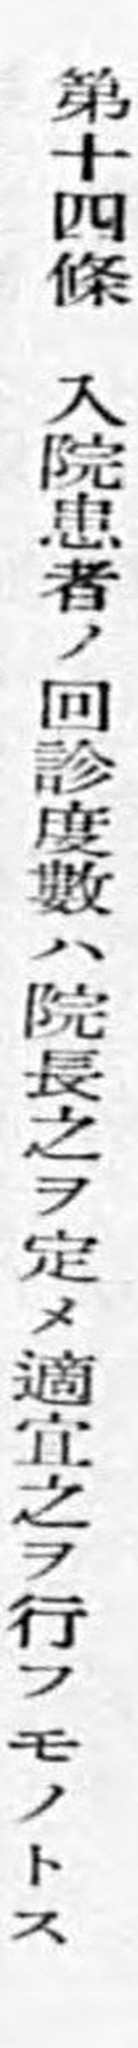第十四条入院患者ノ回診度数ハ院長之ヲ定メ適宜之ヲ行フモノトス
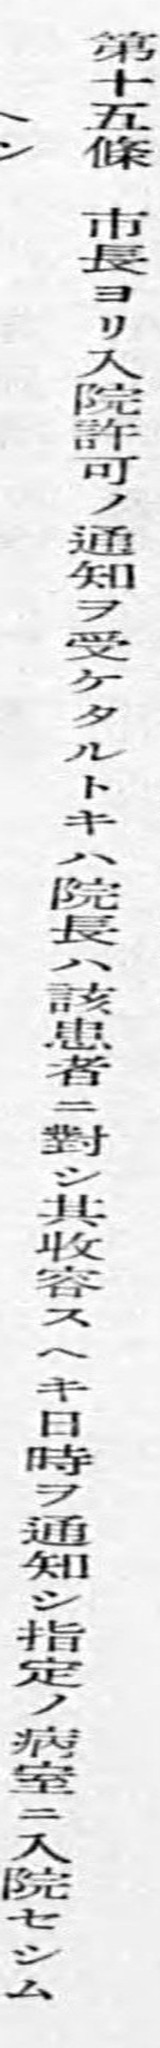第十五条市長ヨリ入院許可ノ通知ヲ受ケタルトキハ院長ハ該患者ニ対シ其収容スヘキ日時ヲ通知シ指定ノ病室ニ入院セシム
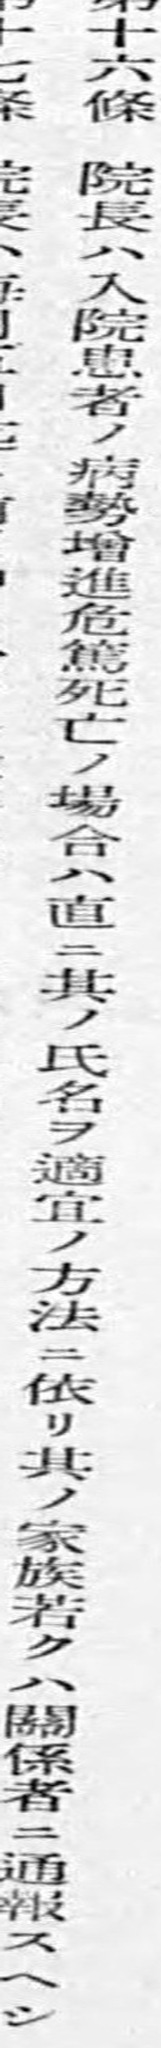第十六条院長ハ入院患者ノ病勢増進危篤死亡ノ場合ハ直ニ其ノ氏名ヲ適宜ノ方法ニ依リ其ノ家族若クハ関係者ニ通報スヘシ
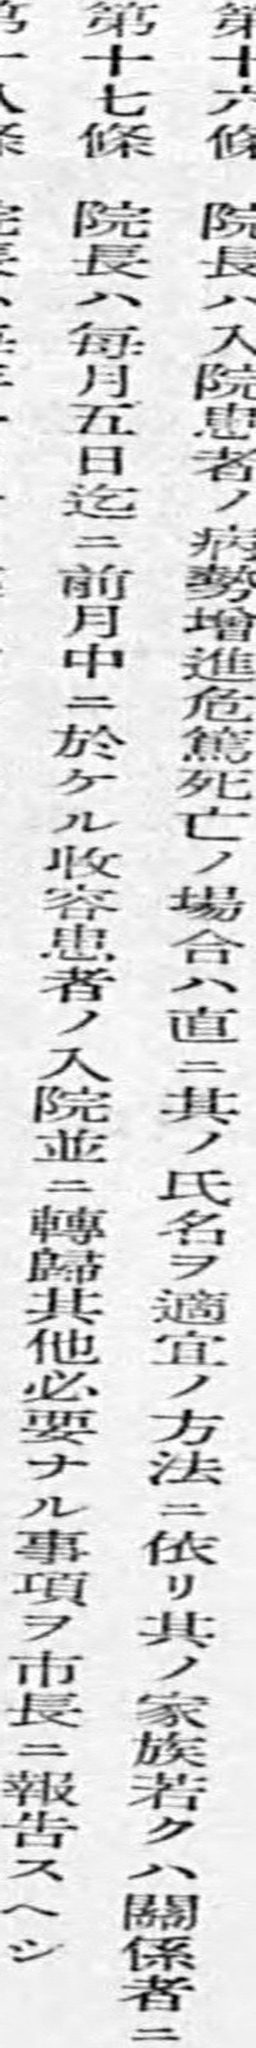第十七条院長ハ毎月五日迄ニ前月中ニ於ケル収容患者ノ入院並ニ転帰其他必要ナル事項ヲ市長ニ報告スヘシ
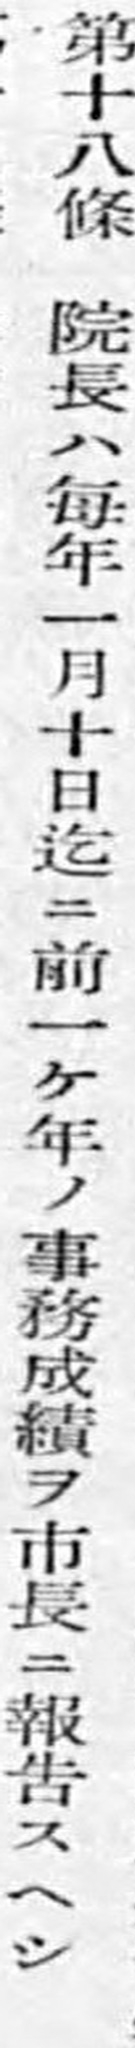第十八条院長ハ毎年一月十日迄ニ前一ヶ年ノ事務成積ヲ市長ニ報告スヘシ
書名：豊橋市立高山病院年報. 昭和12年度
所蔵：国立国会図書館 National Diet Library, JAPAN
